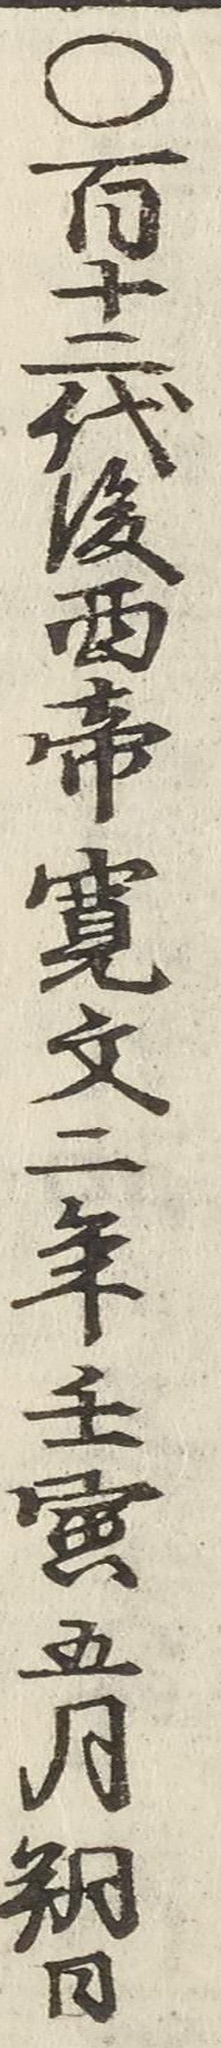○百十二代後西帝寛文二年壬寅五月朔日
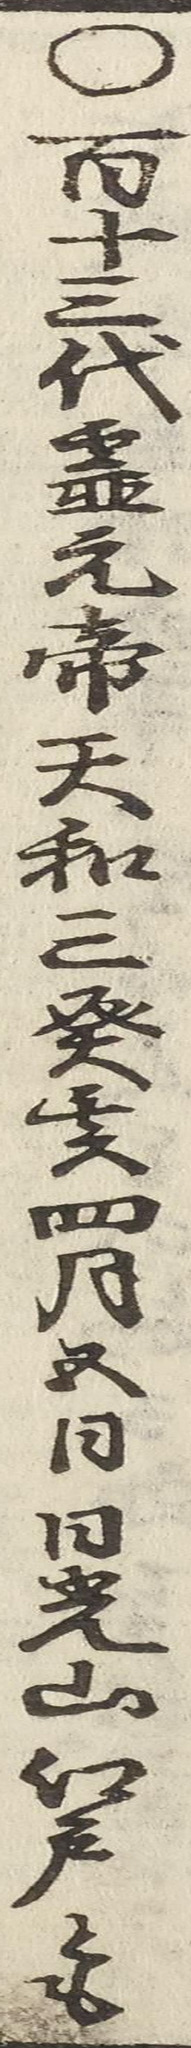○百十三代霊元帝天和三癸亥四月五日日光山江戸とも
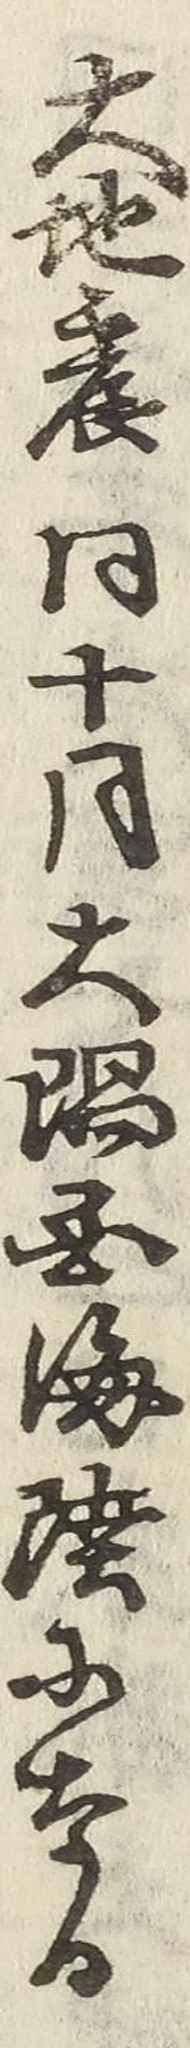大地震同十月大隅国海陸になる
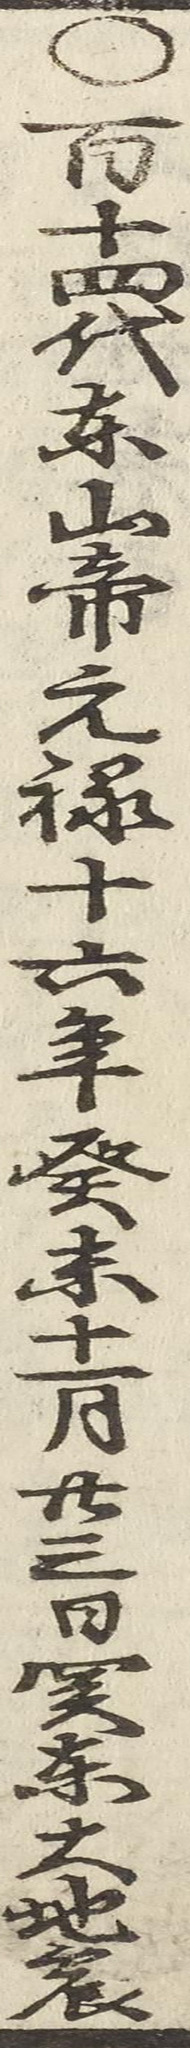○百十四代東山帝元禄十六年癸未十一月廿三日関東大地震
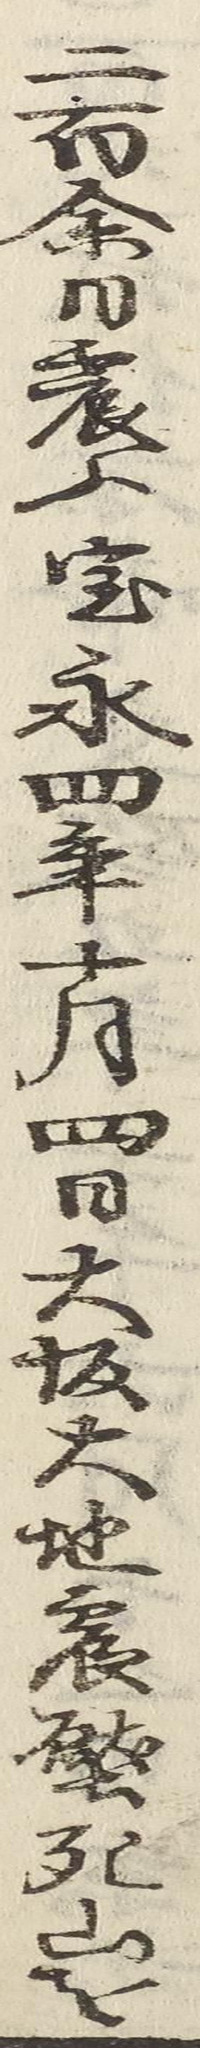二百余日震ふ宝永四年十月四日大坂大地震壓死山を
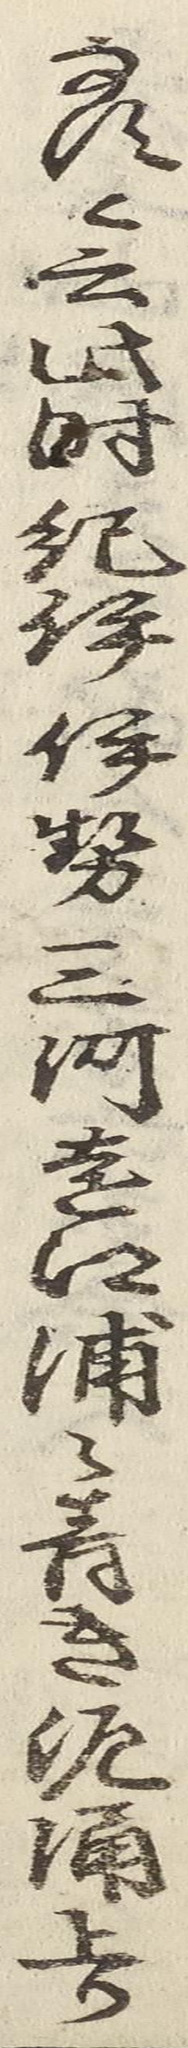なすと？云此時紀伊伊勢三河遠江浦々青き泥涌上り
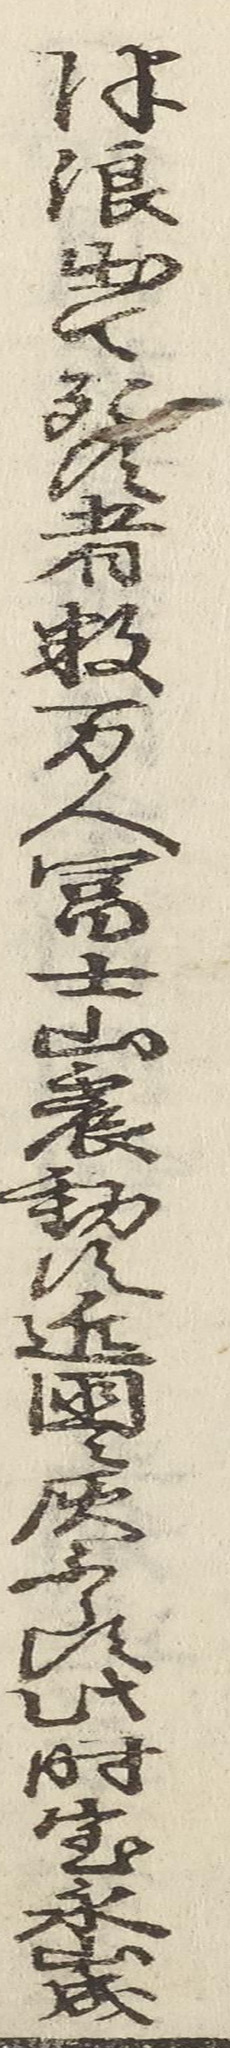津浪出て死す者数万人富士山震動す近国に灰ふらす此時宝永山成
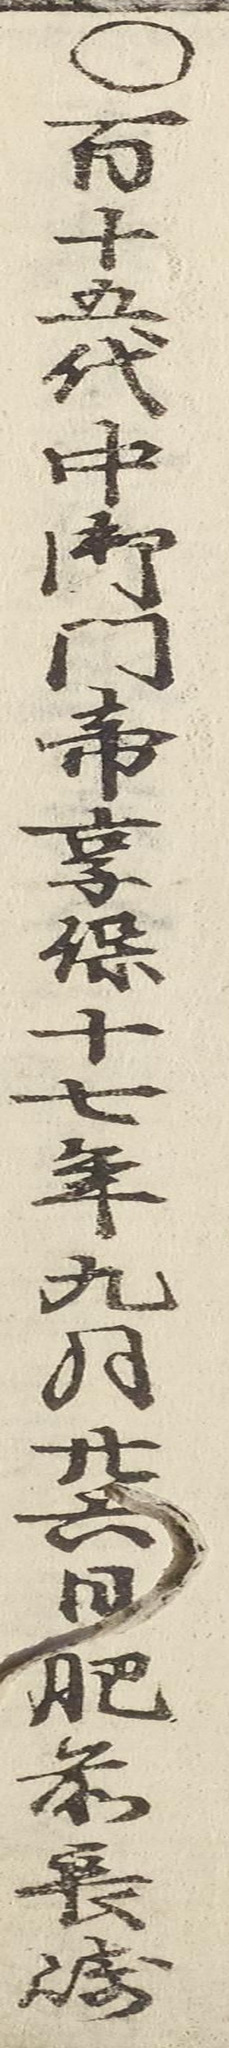○百十五代中御門帝享保十七年九月廿六日肥前長崎
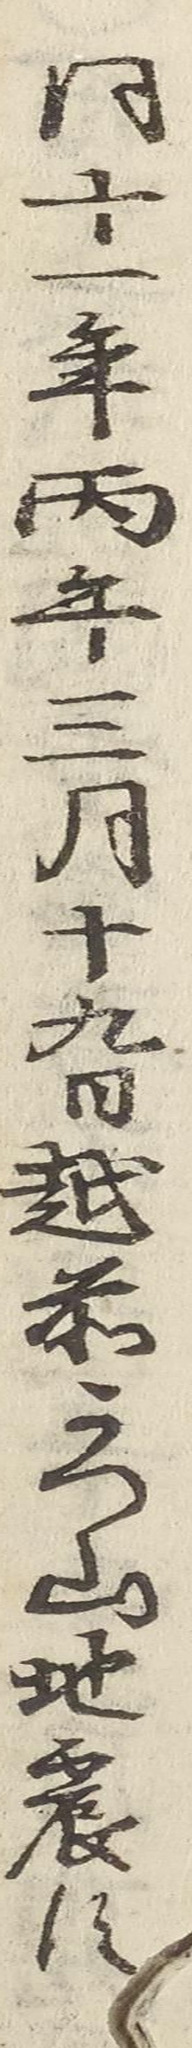同十一年丙午三月十九日越前かつ山地震す

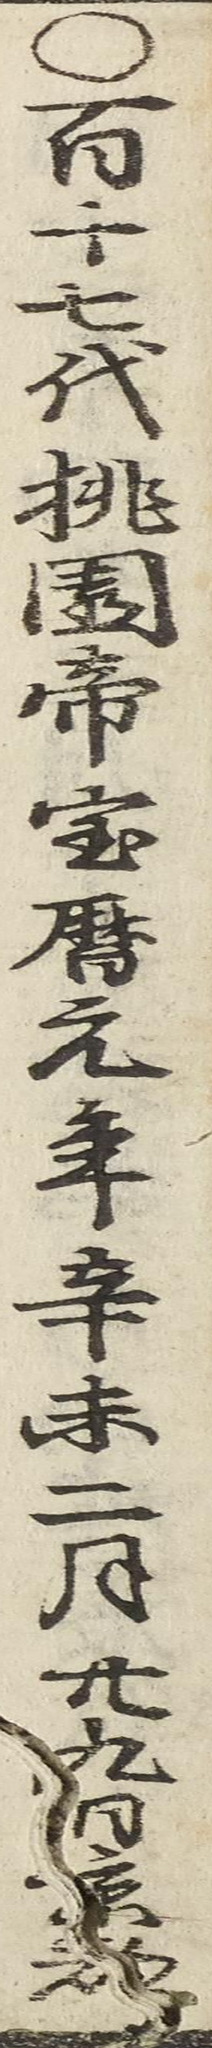○百十七代桃園帝宝暦元年辛未二月廿九日京都
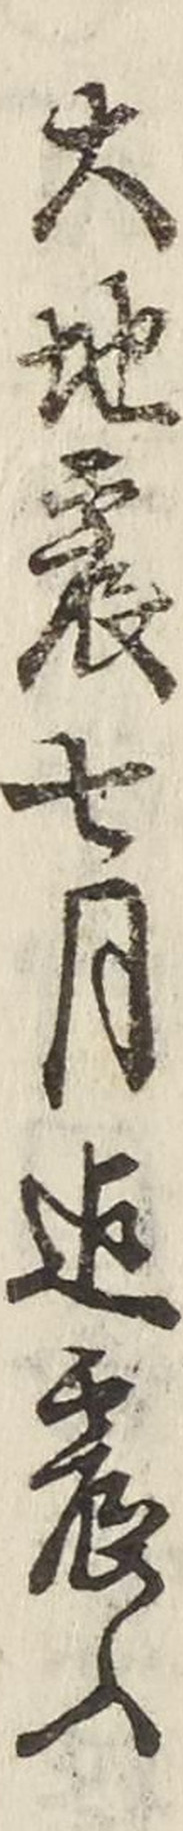大地震七月迄震ふ
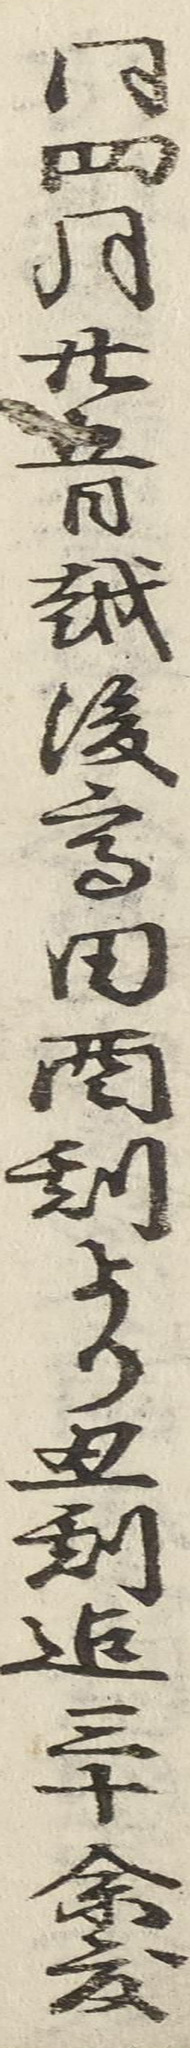同四月廿五日越後高田酉刻より丑刻迄三十余度
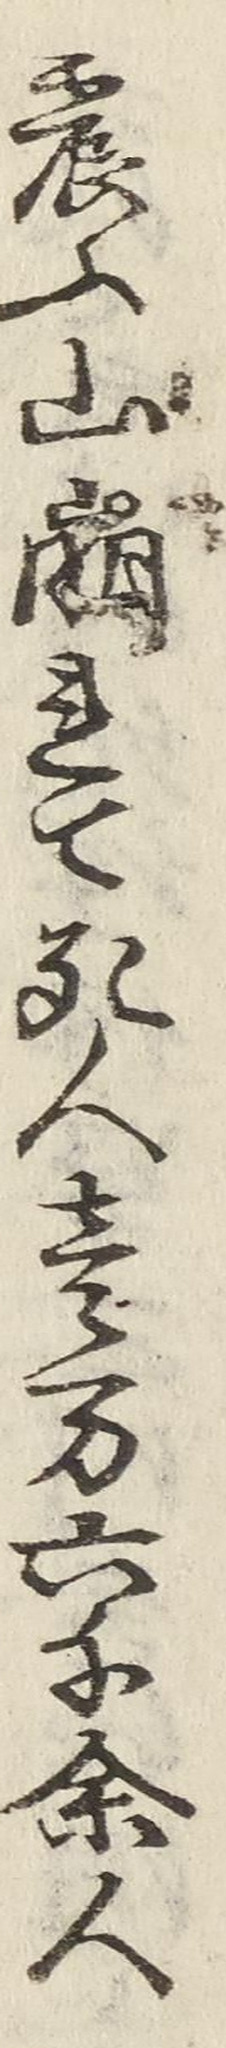震ふ山崩れて死人一万六千余人
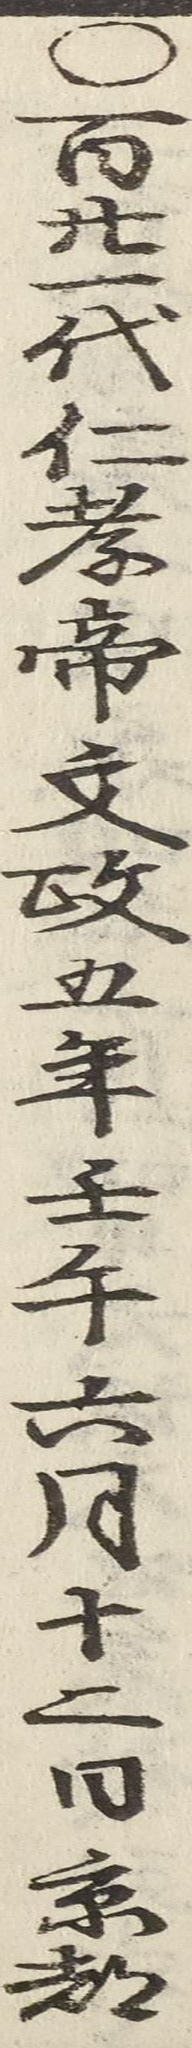○百廿一代仁孝帝文政五年壬午六月十二日京都
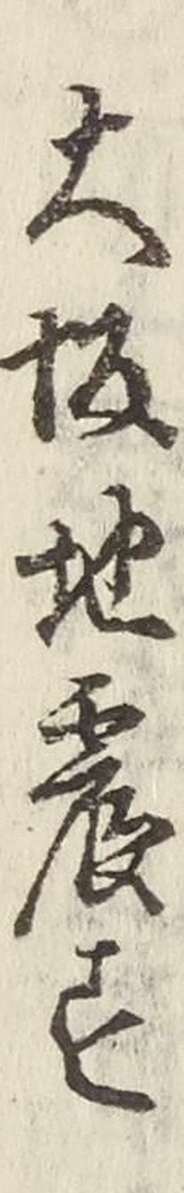大坂地震す
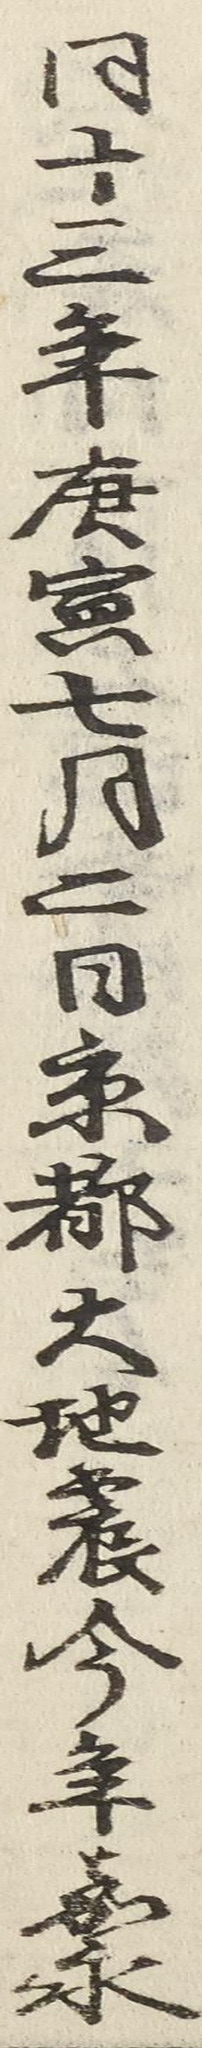同十三年庚寅七月二日京都大地震今年嘉永
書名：大地震世直仕艸紙
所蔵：東京大学地震研究所図書室 Earthquake Research Institute Library, The University of Tokyo, JAPAN
